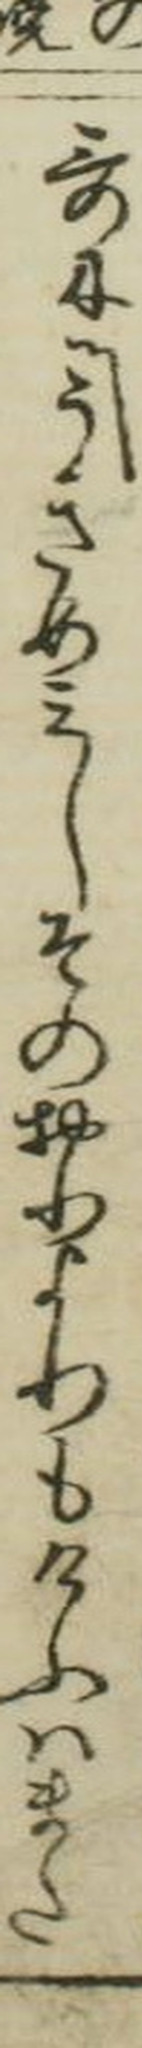哥に〽うきめみしそのおりよりもけふはまた
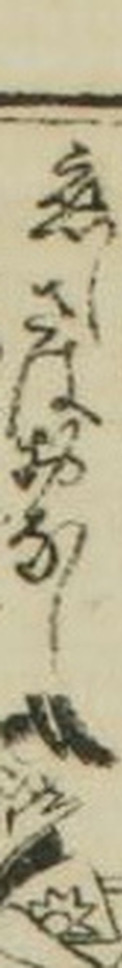恋しさはおなし
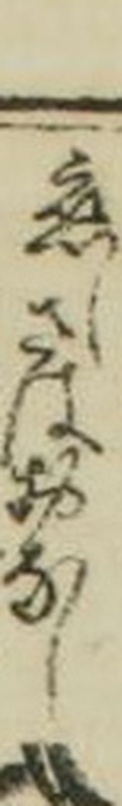恋しさはおなし
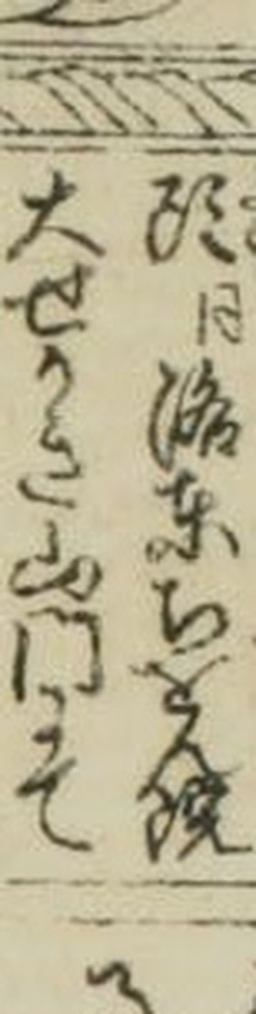大せかき山門にて
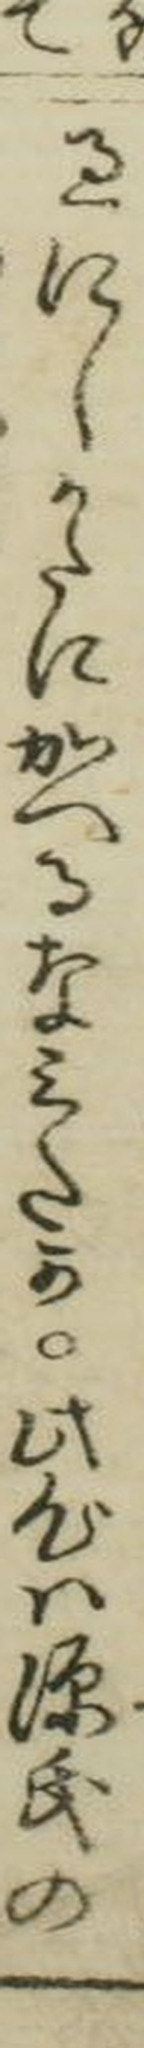過にしかたにかへるなみたか○此心は源氏の
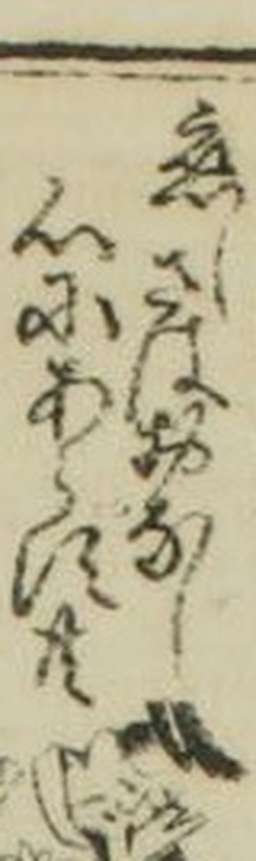心にあらず共
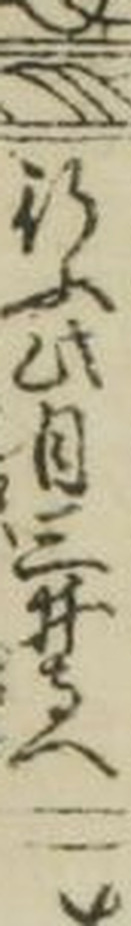行ふ此日三井寺へ
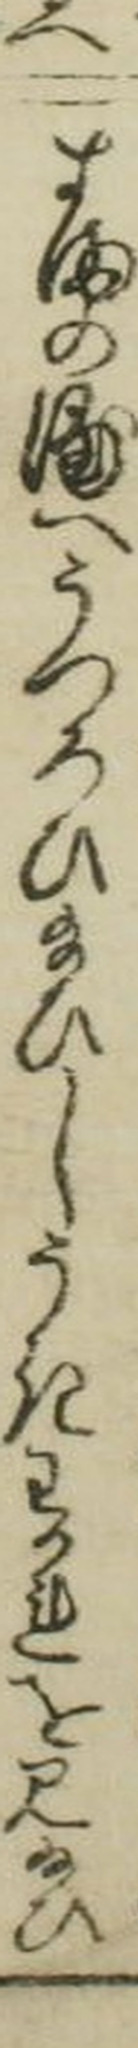すまの浦へうつろひ給ひしうきわかれを見給ひ
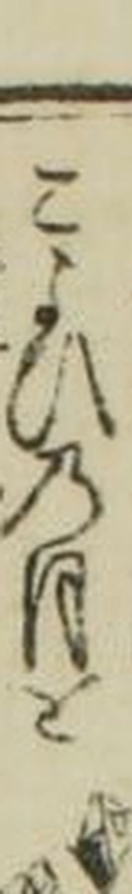こよひの月を
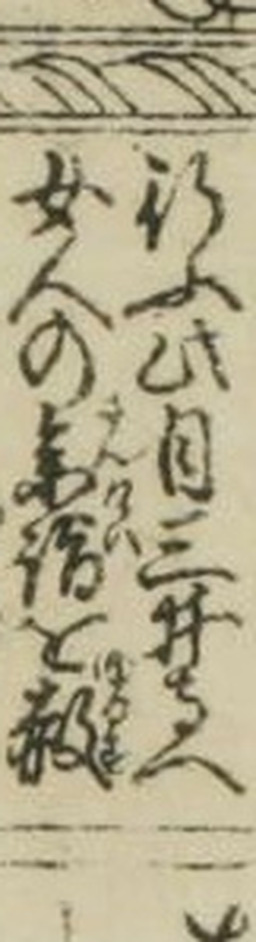女人の参詣を赦
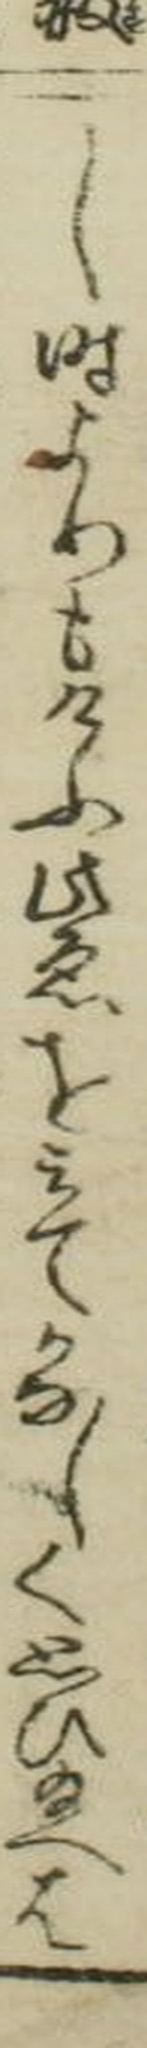し時よりもけふ此ゑをみてかなしく思ひ給へは
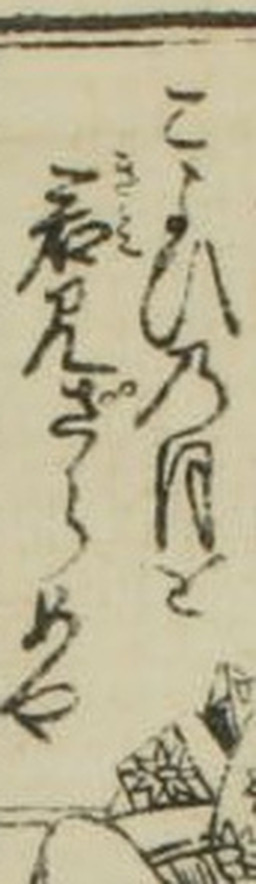君見ざらめや
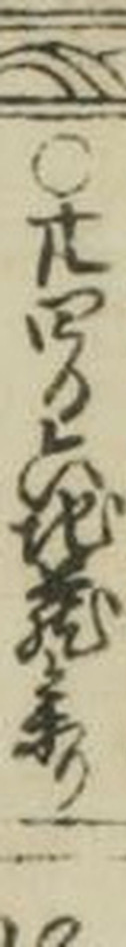○廿四日六地蔵参り
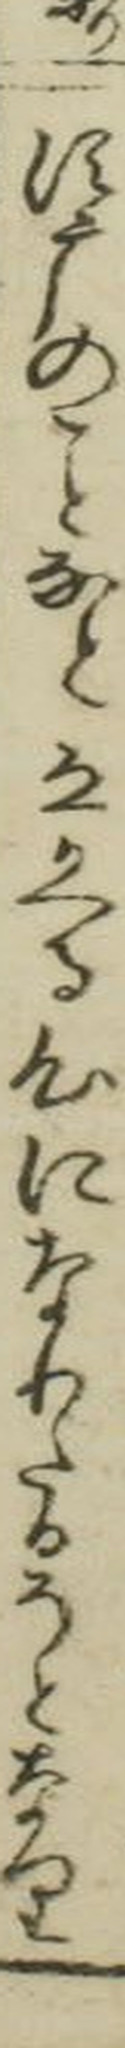須磨のことなと立かへる心になりたるそとなり
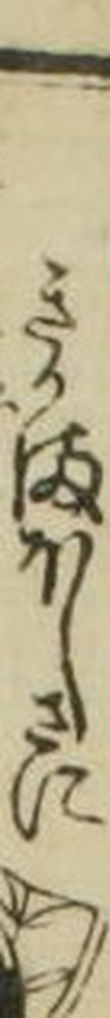きかまほしさに
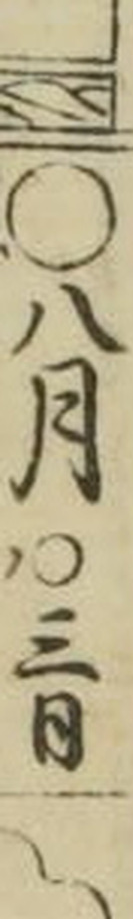○八月○三日
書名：女源氏教訓鑑
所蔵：東京学芸大学附属図書館
